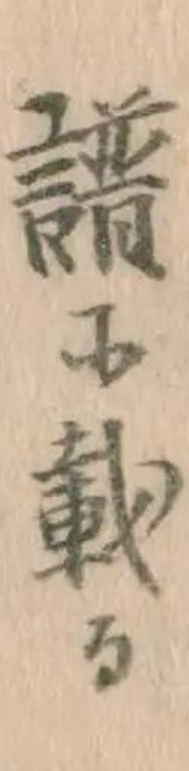譜に載る
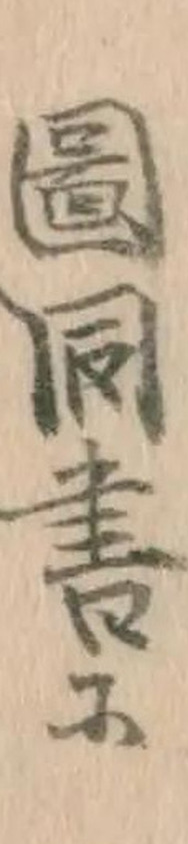図同書に
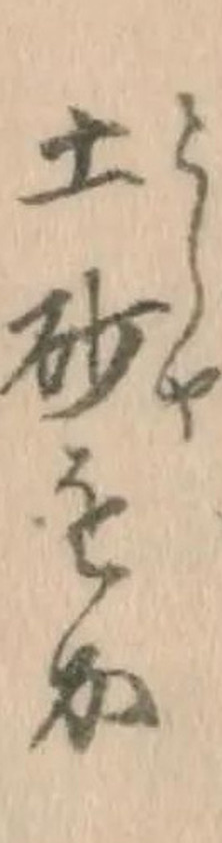土砂をか
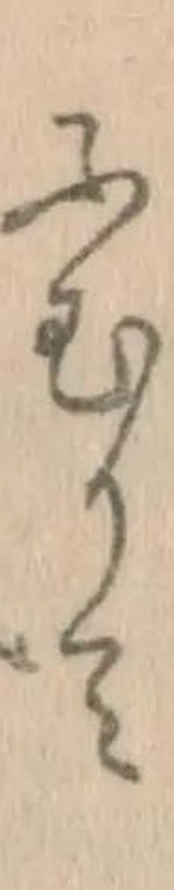ふむりて
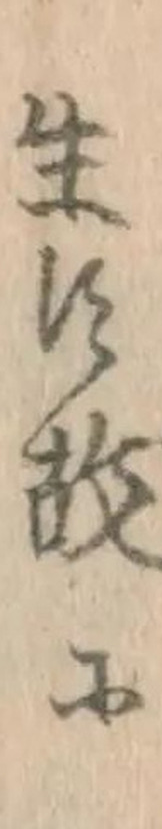生す故に
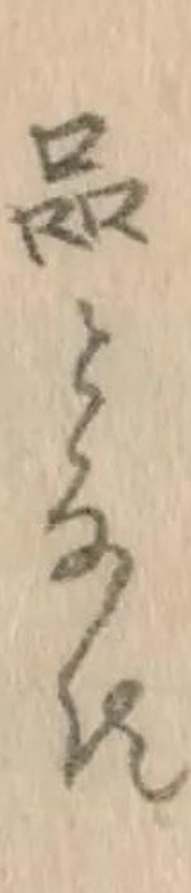品となす
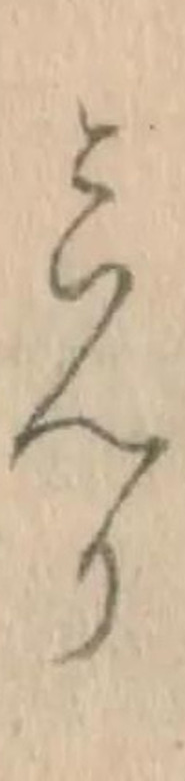といへり
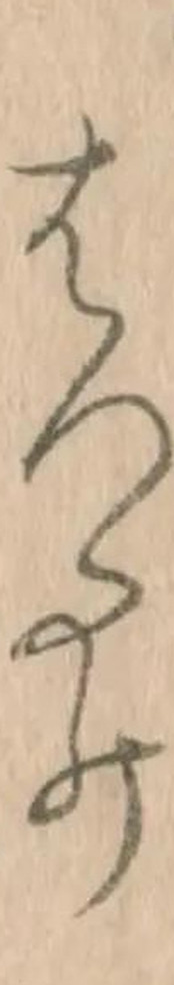はつたけ
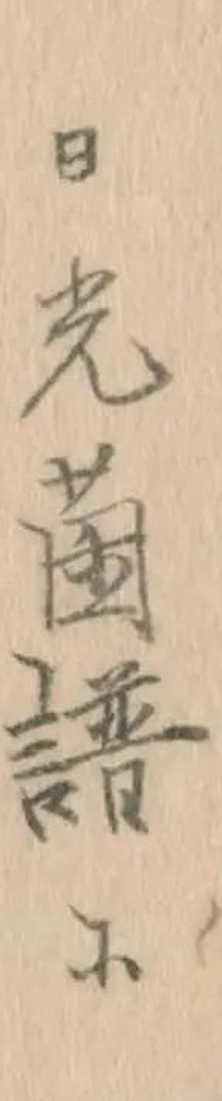日光菌譜に
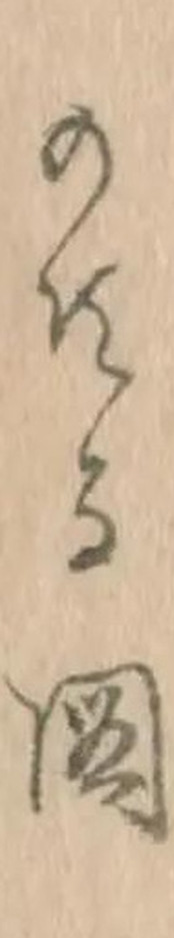のする図

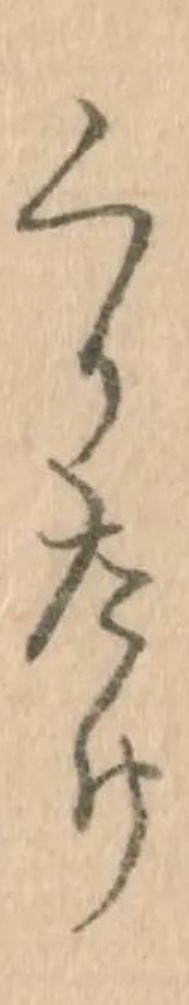くりたけ
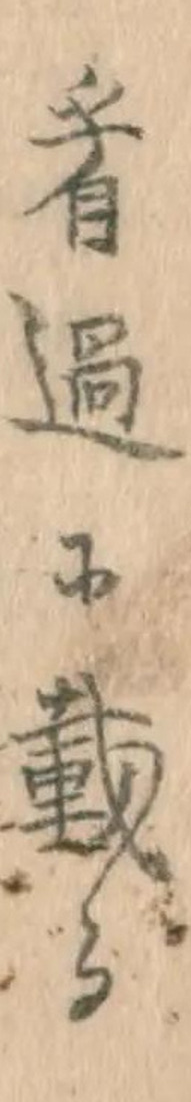看過に載る
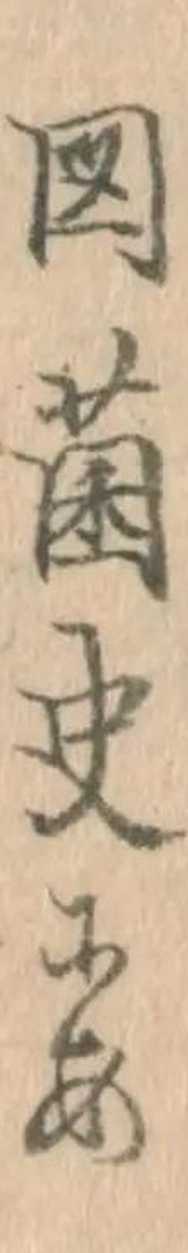図菌史にあ
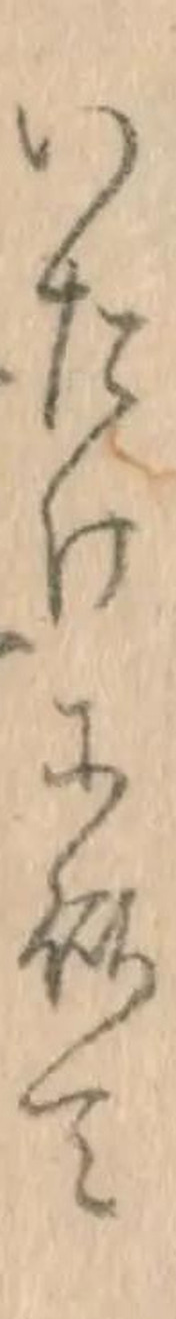いたけに似て
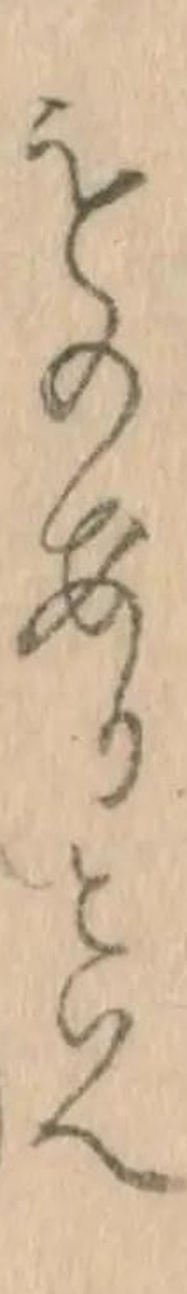ものありといへり
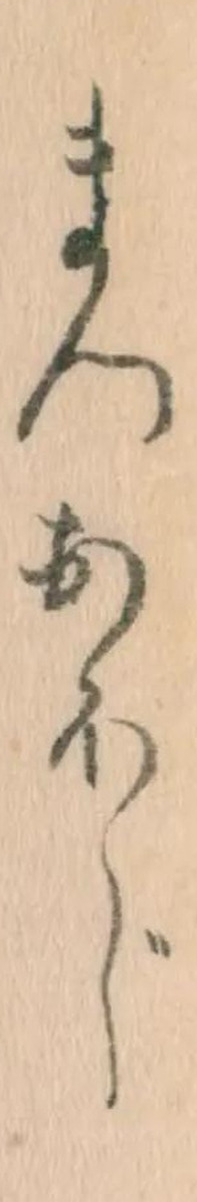まつおほじ
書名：本草図譜. 巻55-57
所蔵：国立国会図書館 National Diet Library, JAPAN
